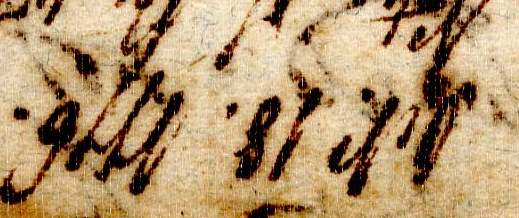Oct^r. 18. 1776.
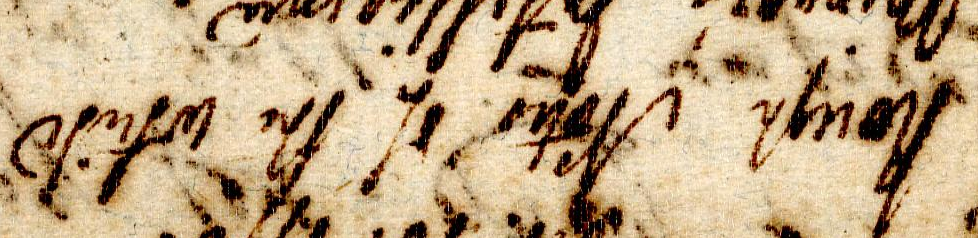Rough Notes of the white
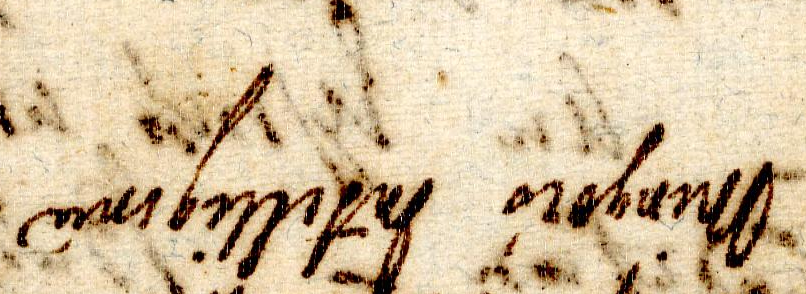Mingoe's Intelligence.
